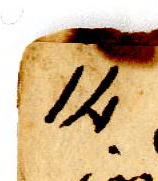14
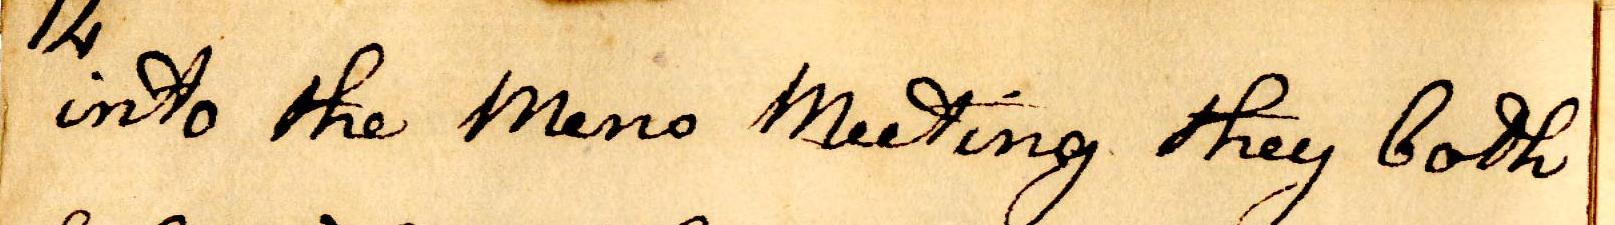into the Mens Meeting they both
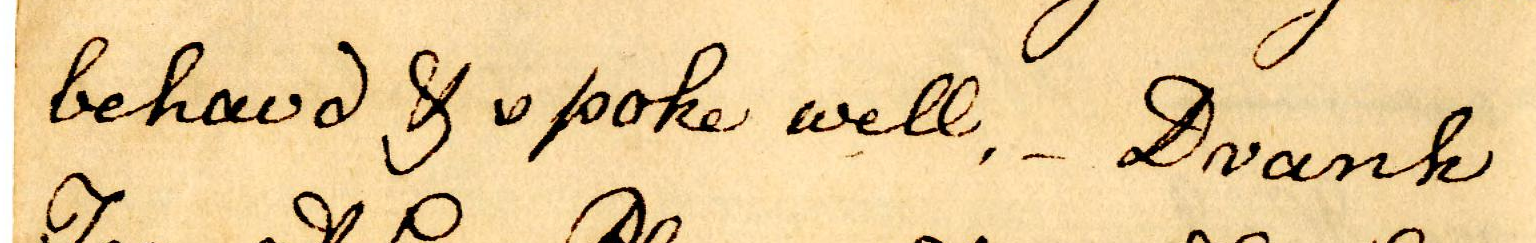behavd & spoke well,- Drank
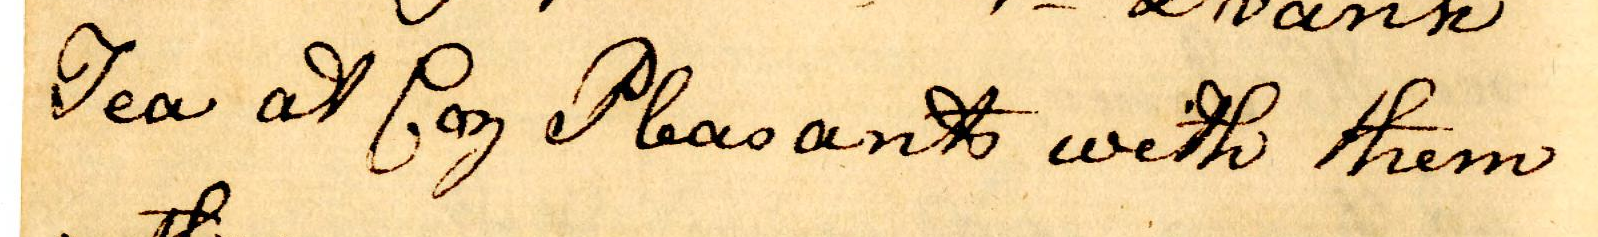Tea at Coz Pleasants with them
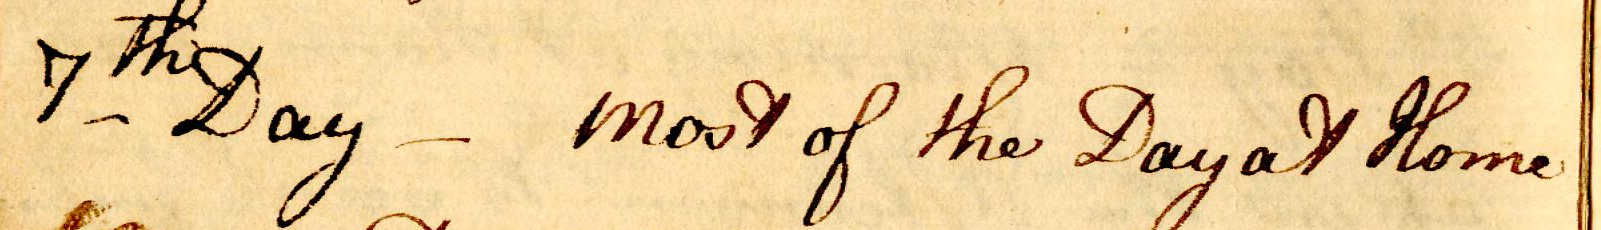7^th Day- most of the Day at Home
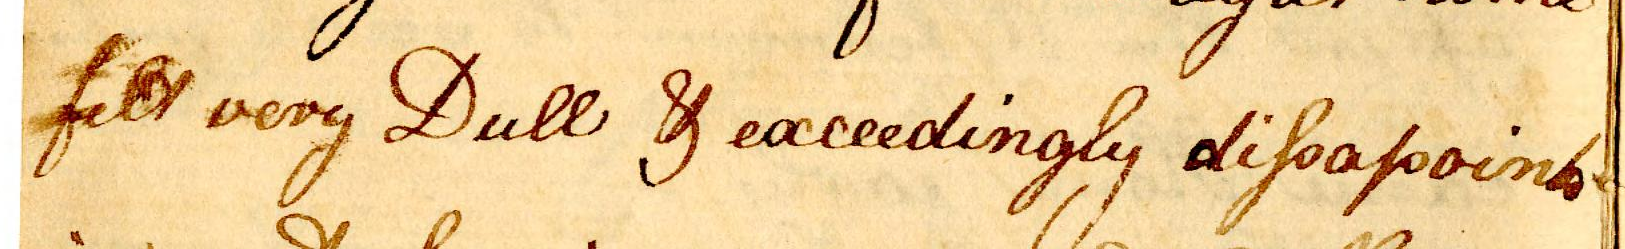felt very Dull & exceedingly dissapoint
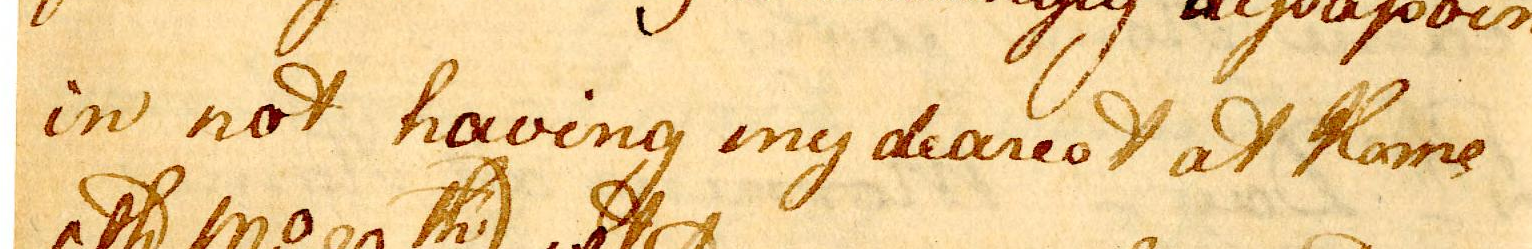in not having my dearest at Home
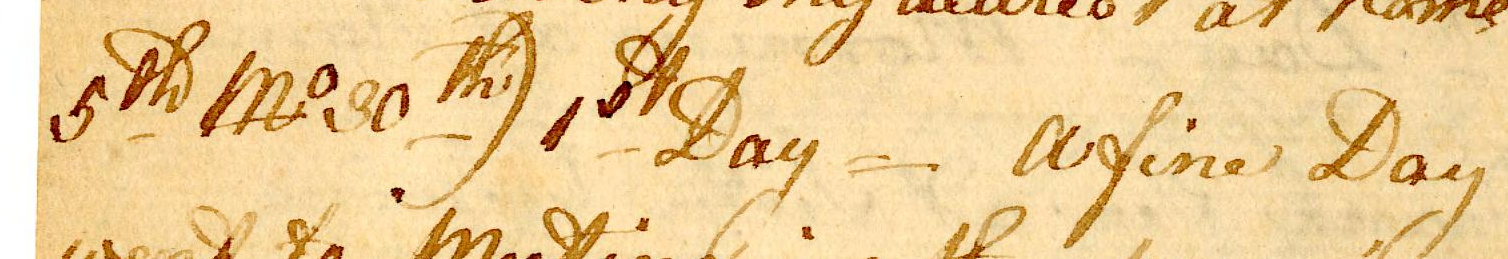5^th M^o 30^th) 1^st Day- A fine Day
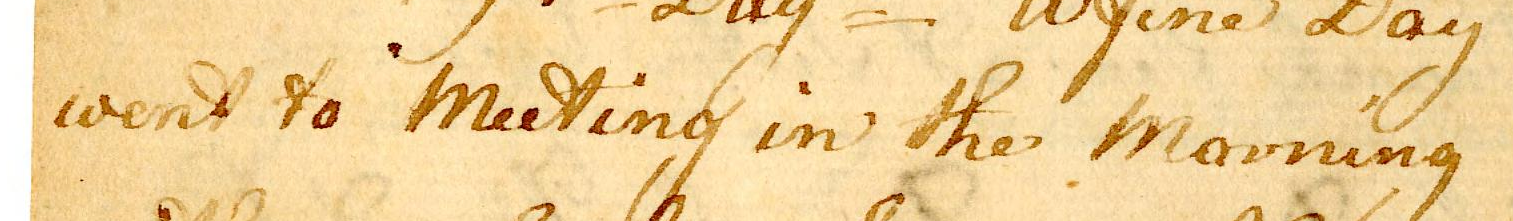went to Meeting in the Morning
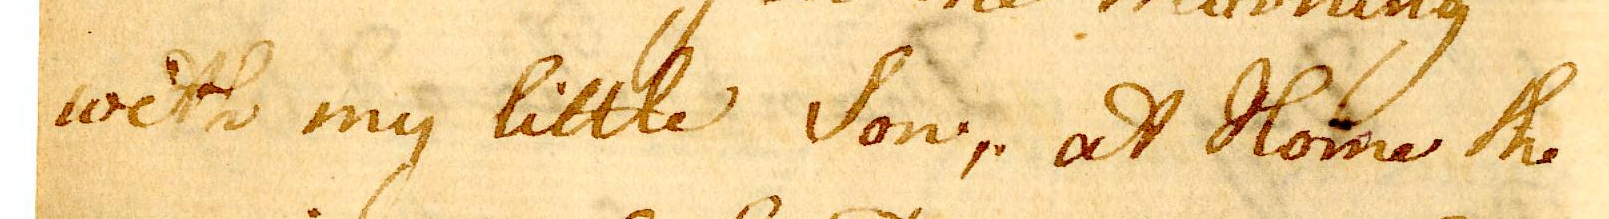with my little Son, at Home the
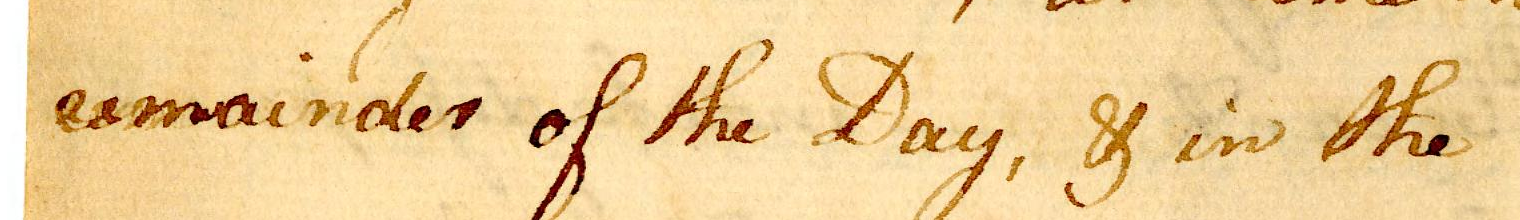remainder of the Day, & in the
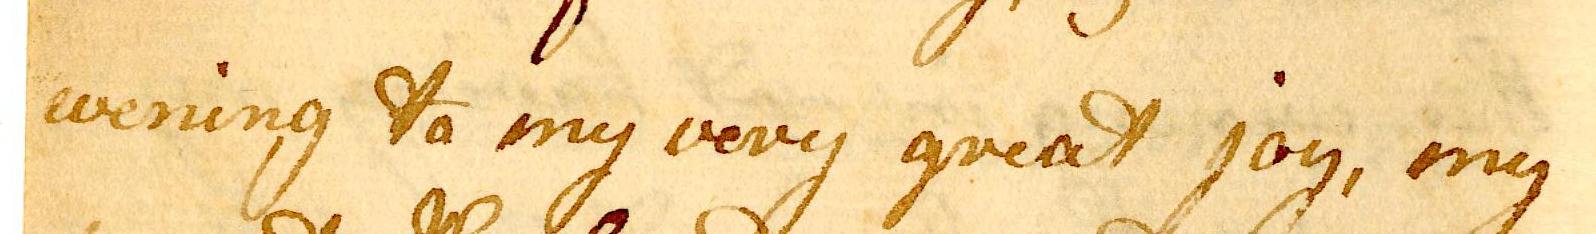evening to my very great joy, my
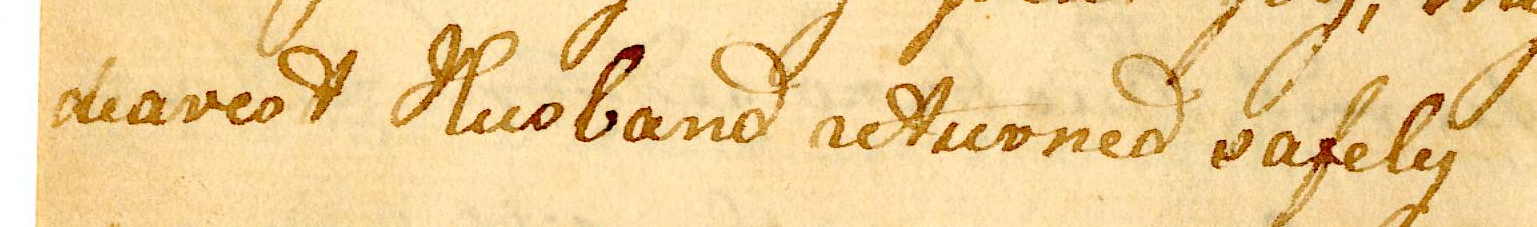dearest Husband returned safely
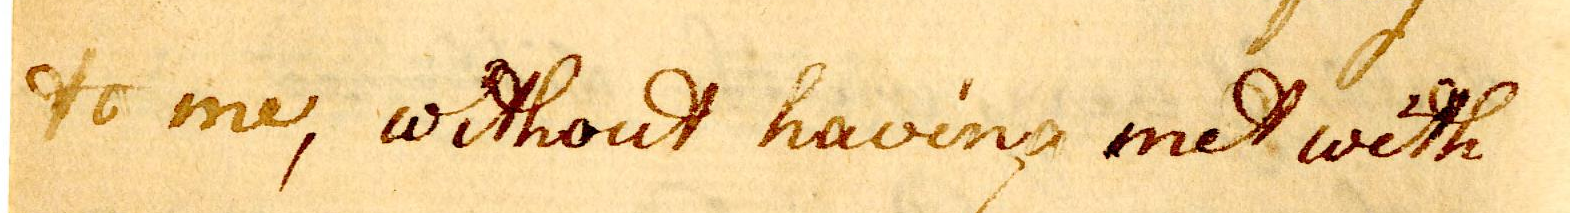to me, without having met with
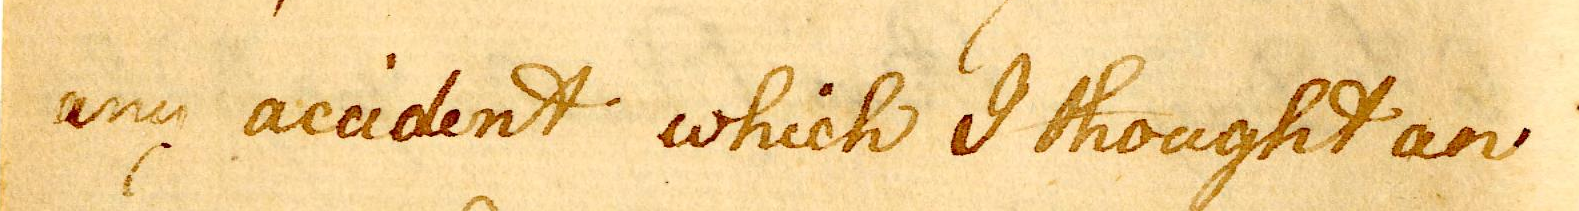any accident which I thought an
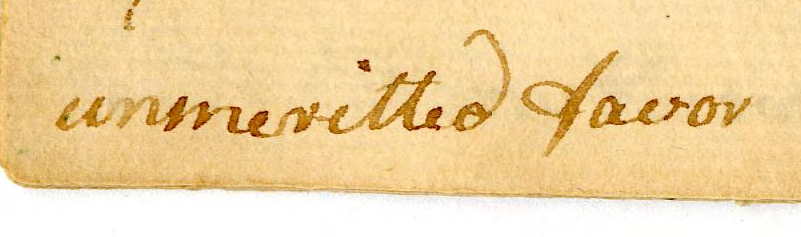unmeritted favor
